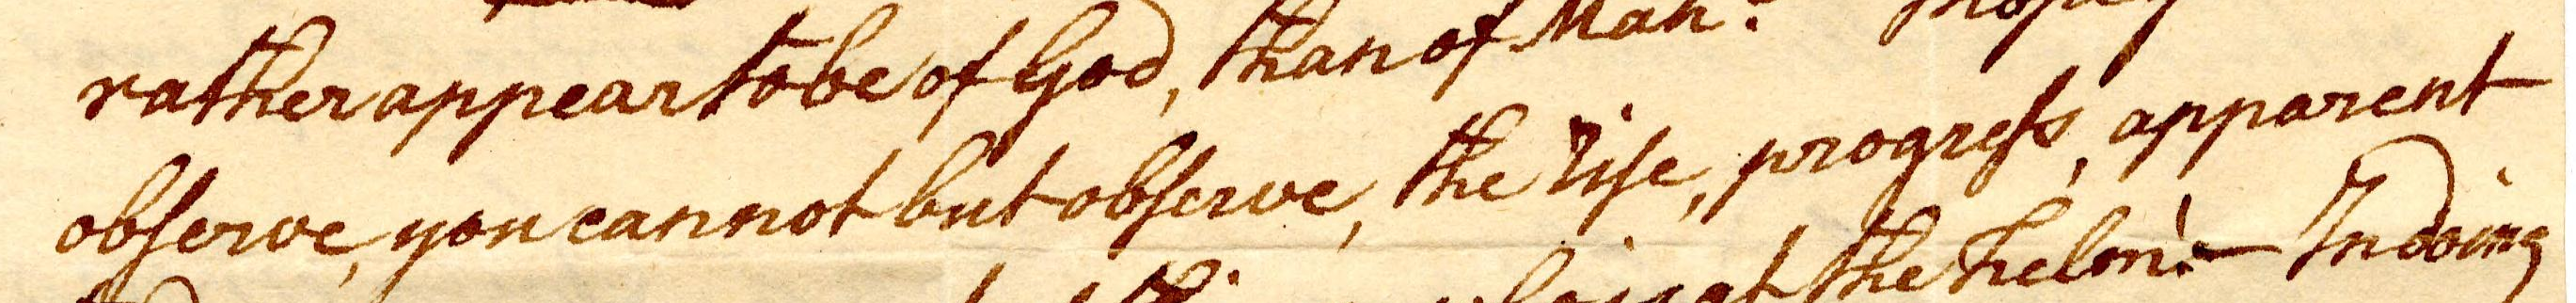observe, you cannot but observe, the rise, progress, apparent
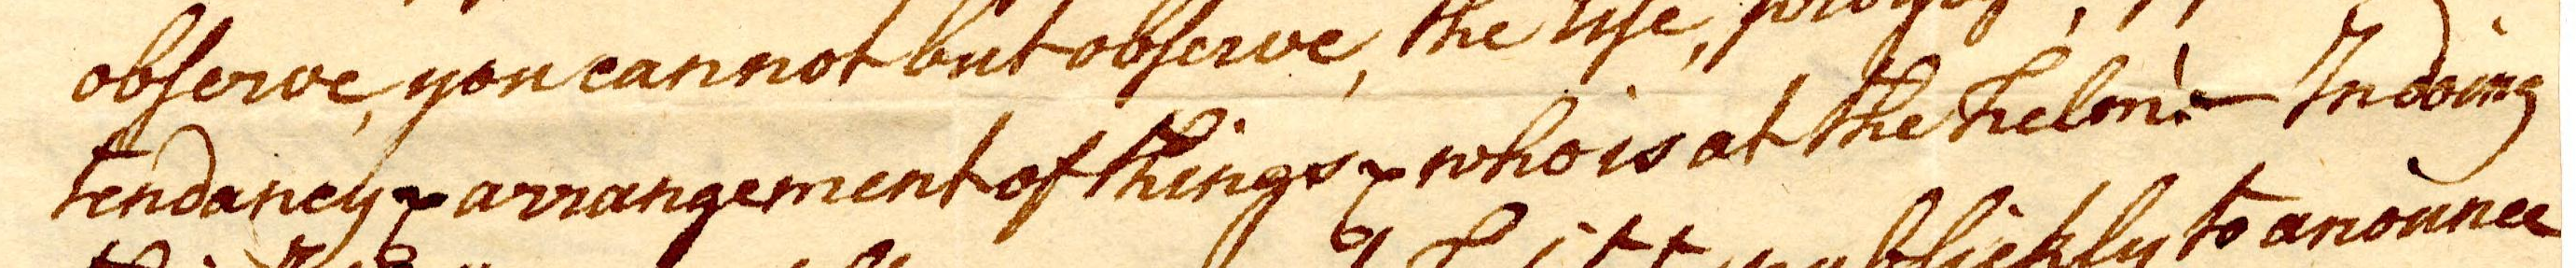tendancy & arrangement of things & who is at the helm!- In doing
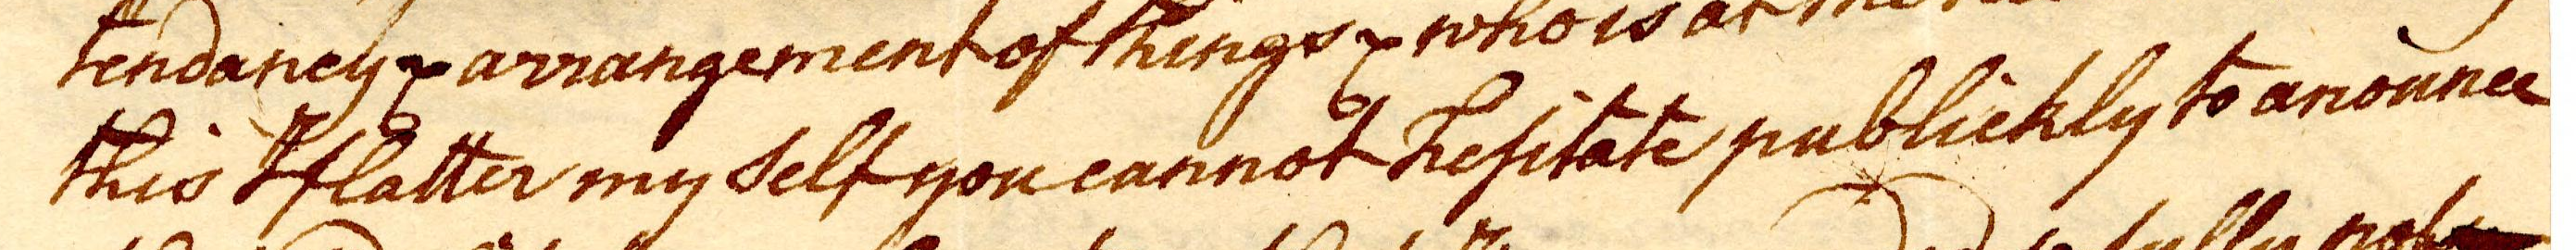this I flatter my self you cannot hesitate publickly to anounce
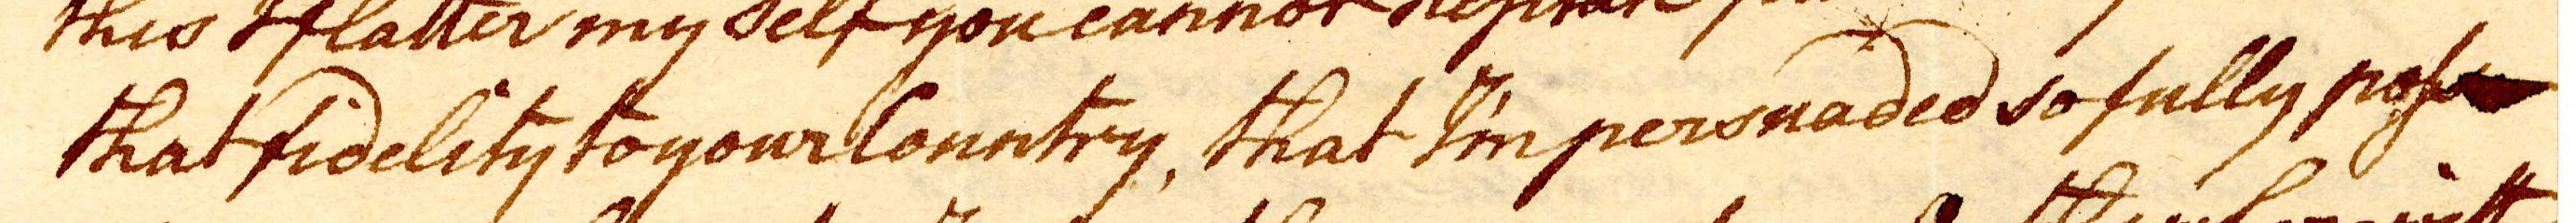that fidelity to your Country, that I'm persuaded so fully poss-
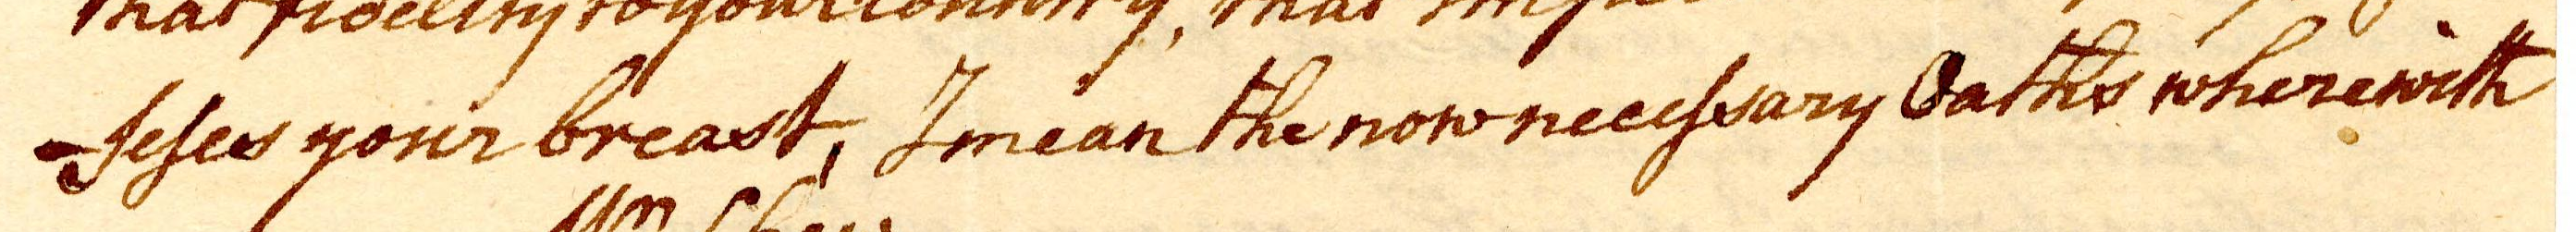-seses your breast, I mean the now necessary Oaths wherewith
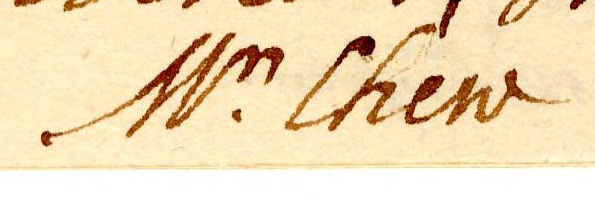M^r. Chew
